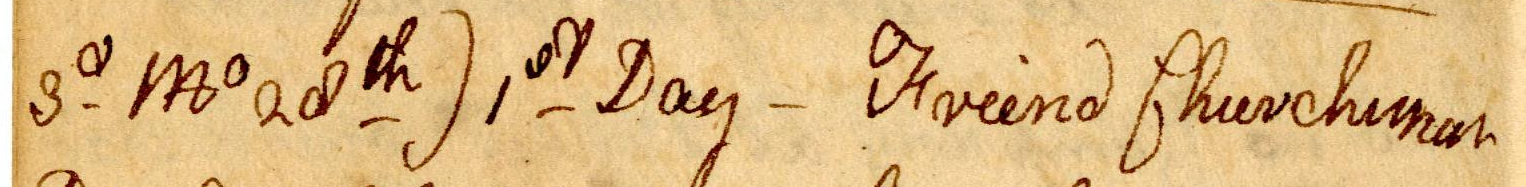3^d M^o 28^th) 1^st Day- Friend Churchiman
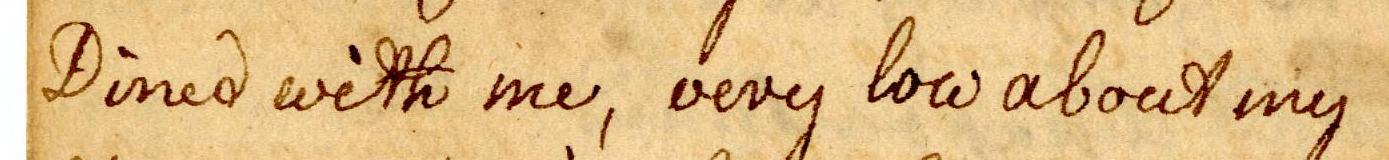Dined with me, very low about my
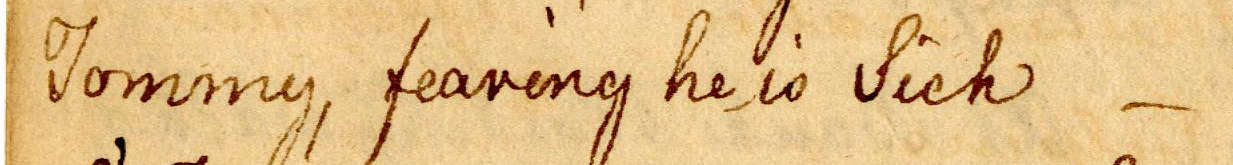Tommy, fearing he is Sick-
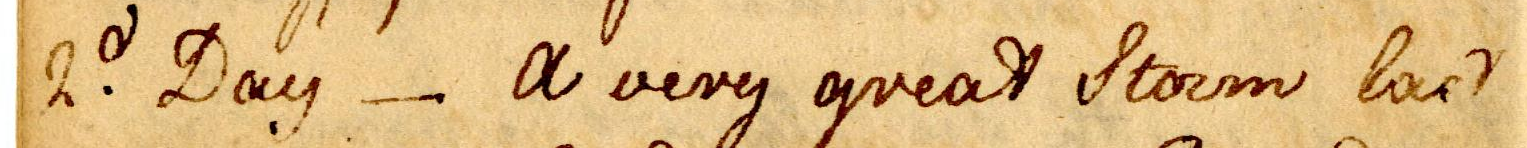2^d. Day- A very great Storm last
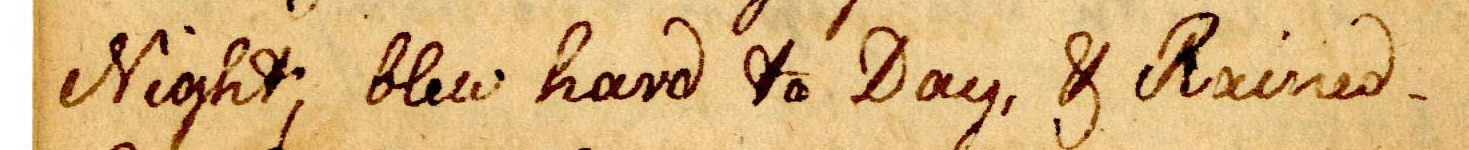Night, blew hard to Day, & Rained-
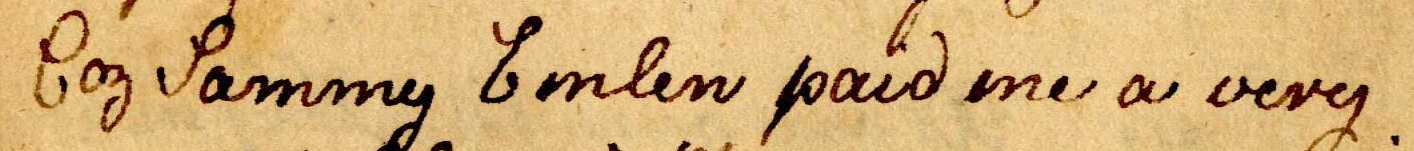Coz Sammy Emlen paid me a very
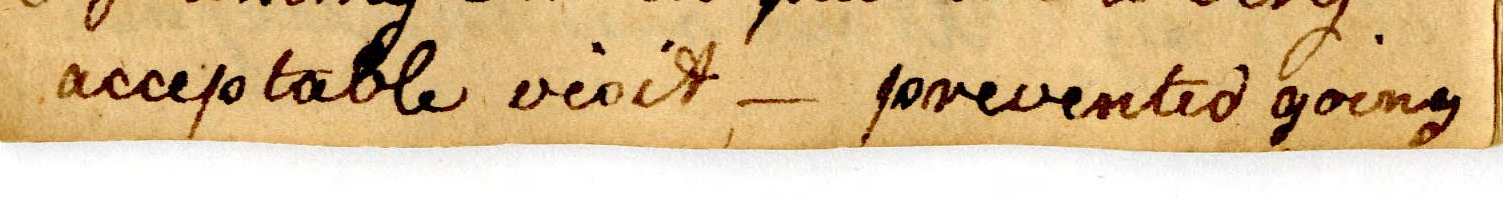arceptable visit- prevented going
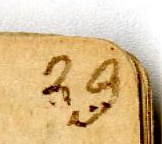29
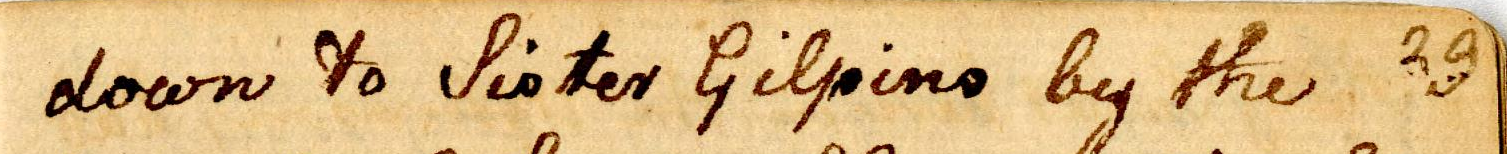down to Sister Gilpins by the
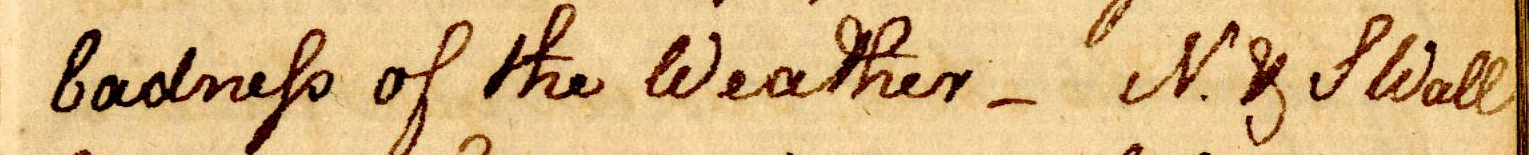badness of the Weather- N. & S Wall
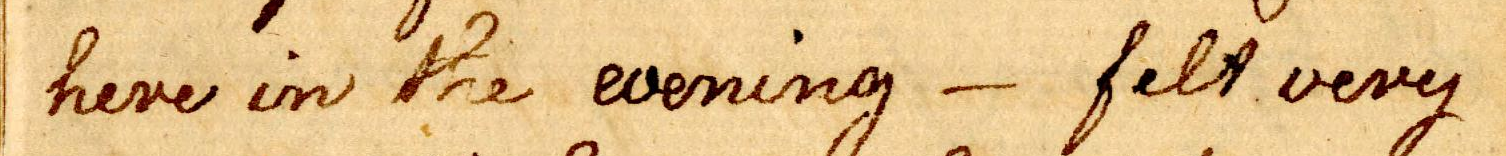here in the evening- felt very
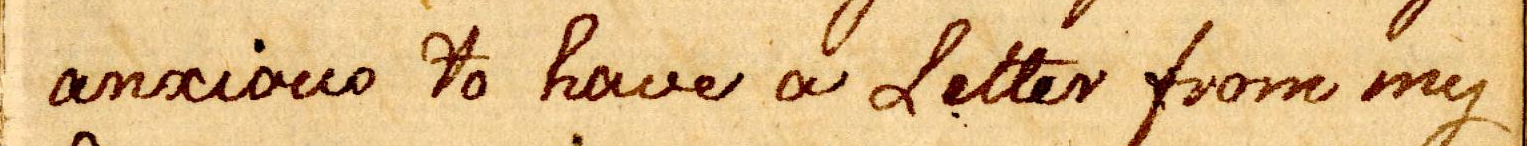anxious to have a Letter from my
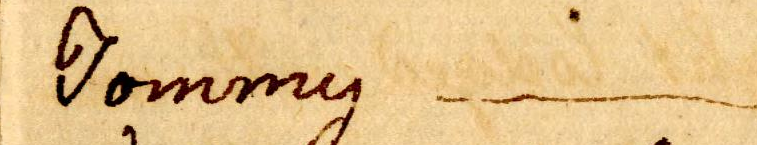Tommy-
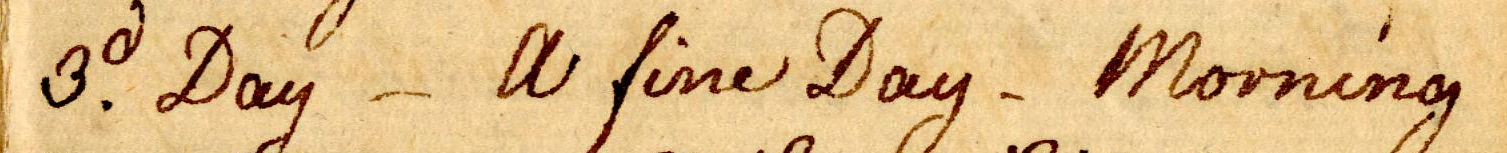3^d. Day- A fine Day- Morning
